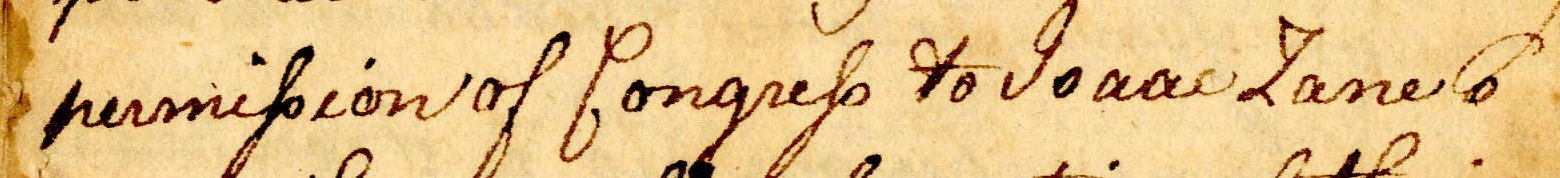permission of Congress to Isaac Zanes
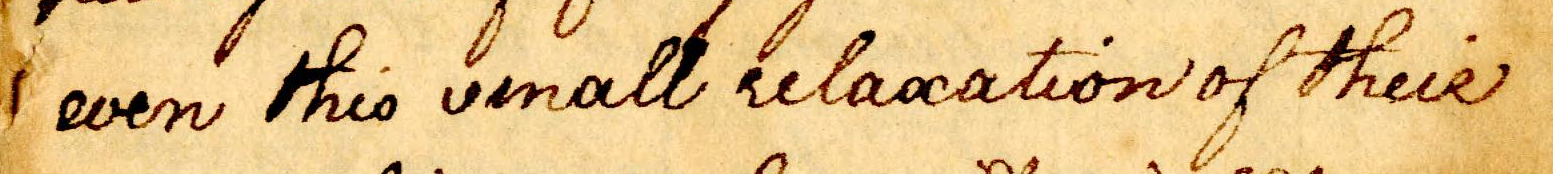even this small relaxation of their
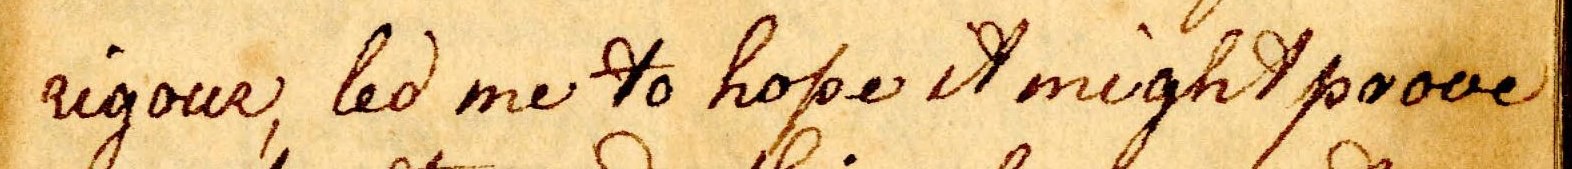rigour led me to hope it might prove
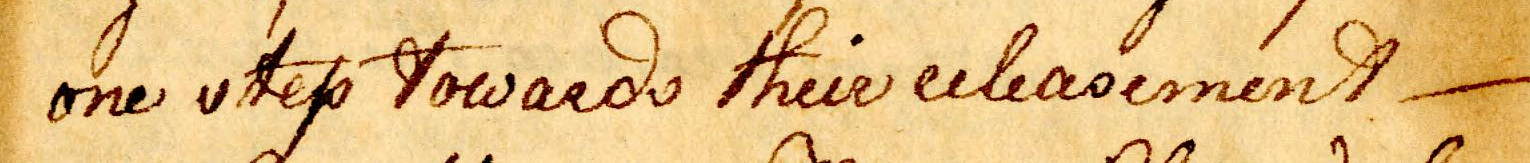one step towards their releasement-
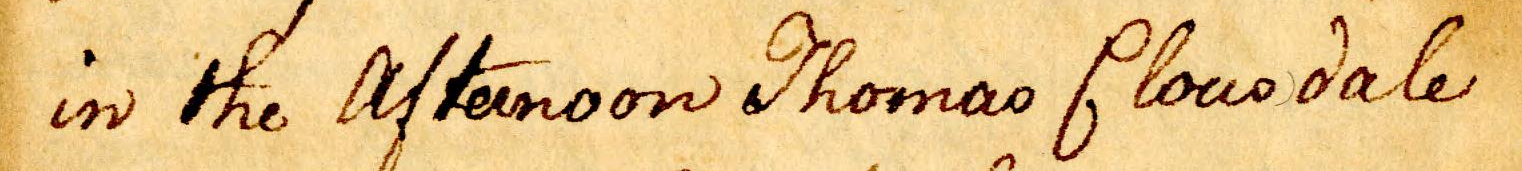in the Afternoon Thomas Clousdale
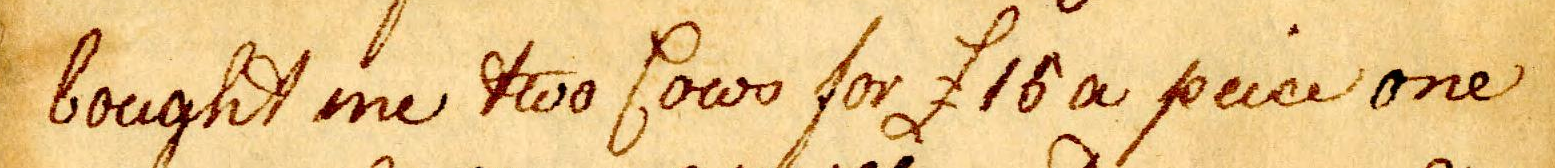bought me two Cows for £15 a peice one
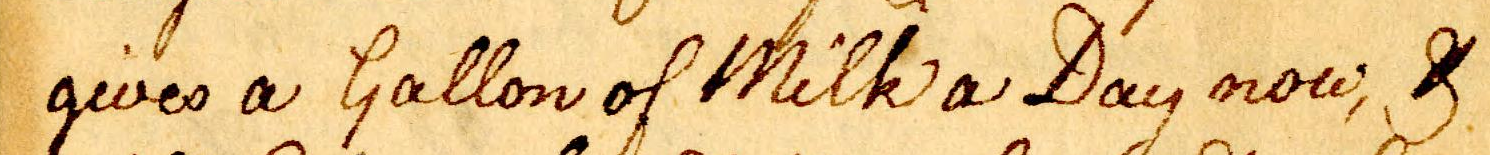gives a Gallon of Milk a Day now, &
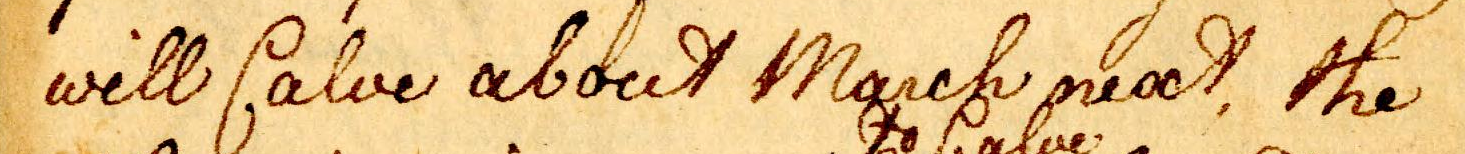will Calve about March next, the
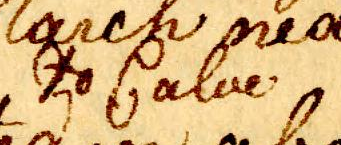to Calve
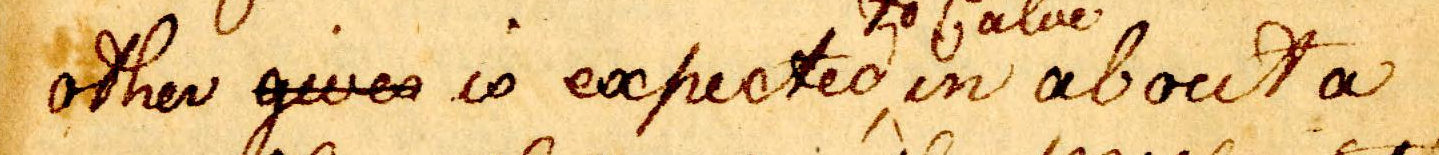other gives is expected ^ in about a
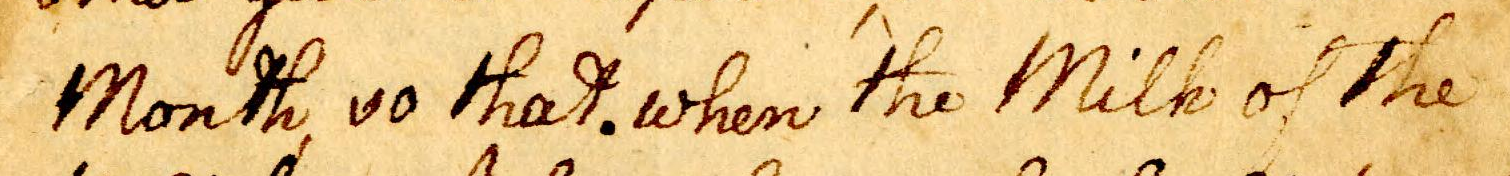Month so that when the Milk of the
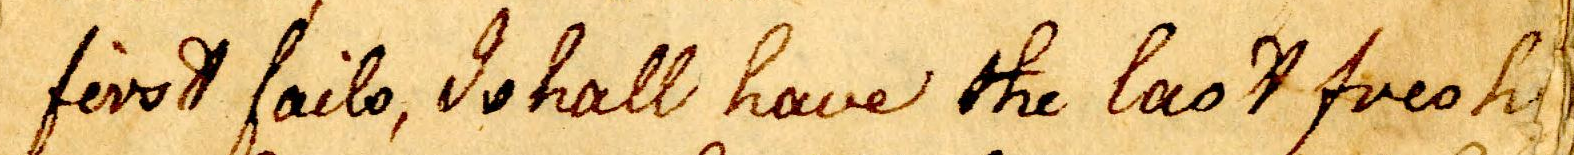first fails, I shall have the last fresh
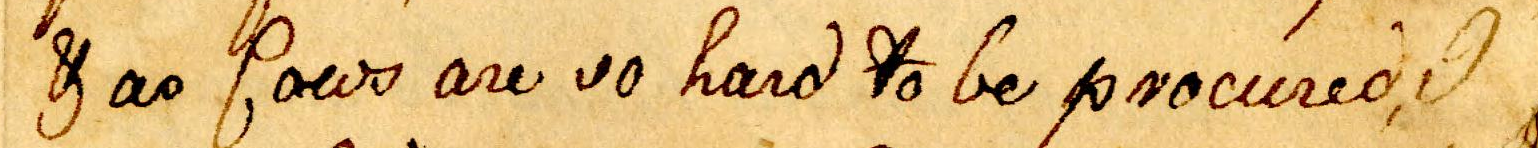& as Cows are so hard to be procured, I
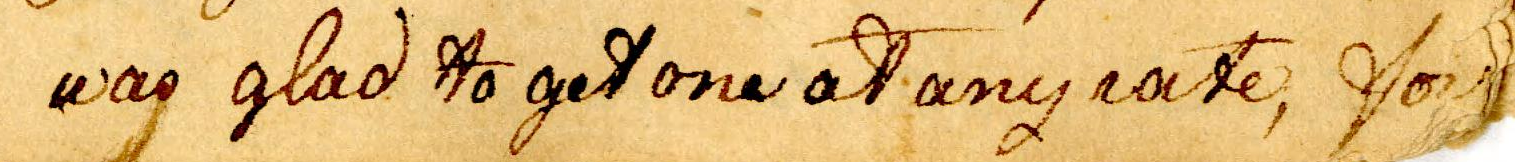way glad to get one at any rate, for
